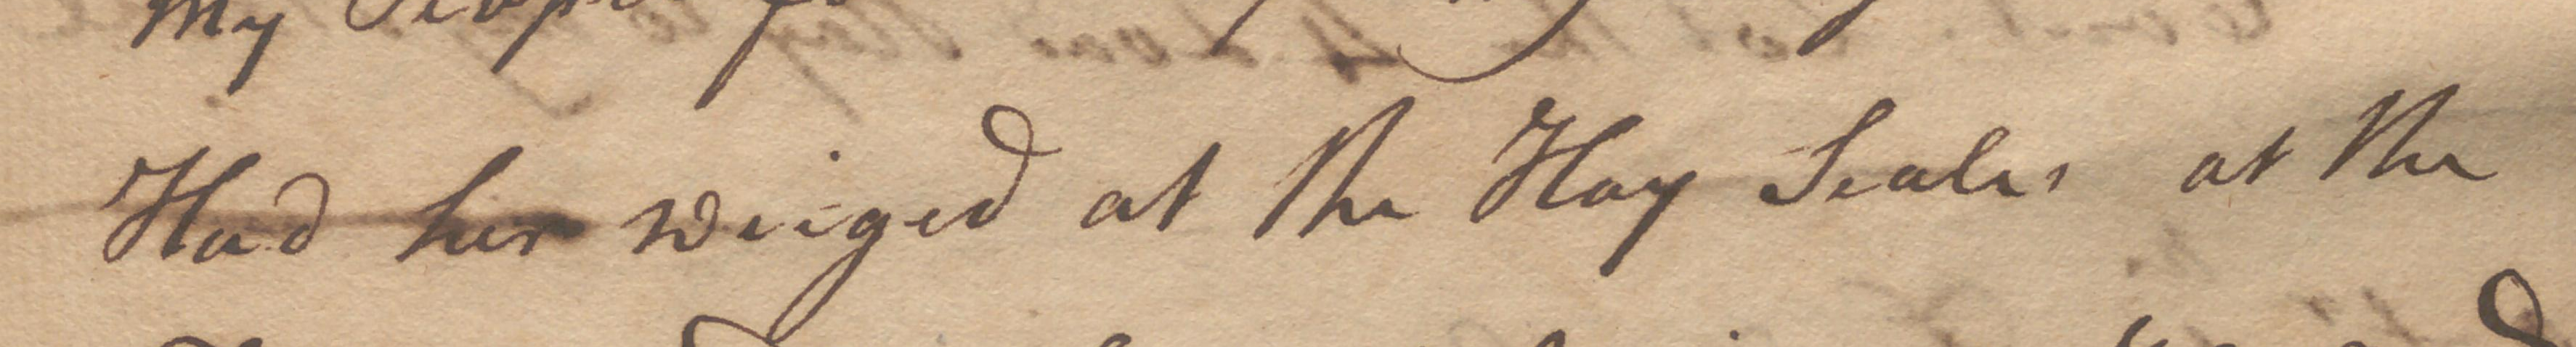Had her weiged at the Hay Scales at the
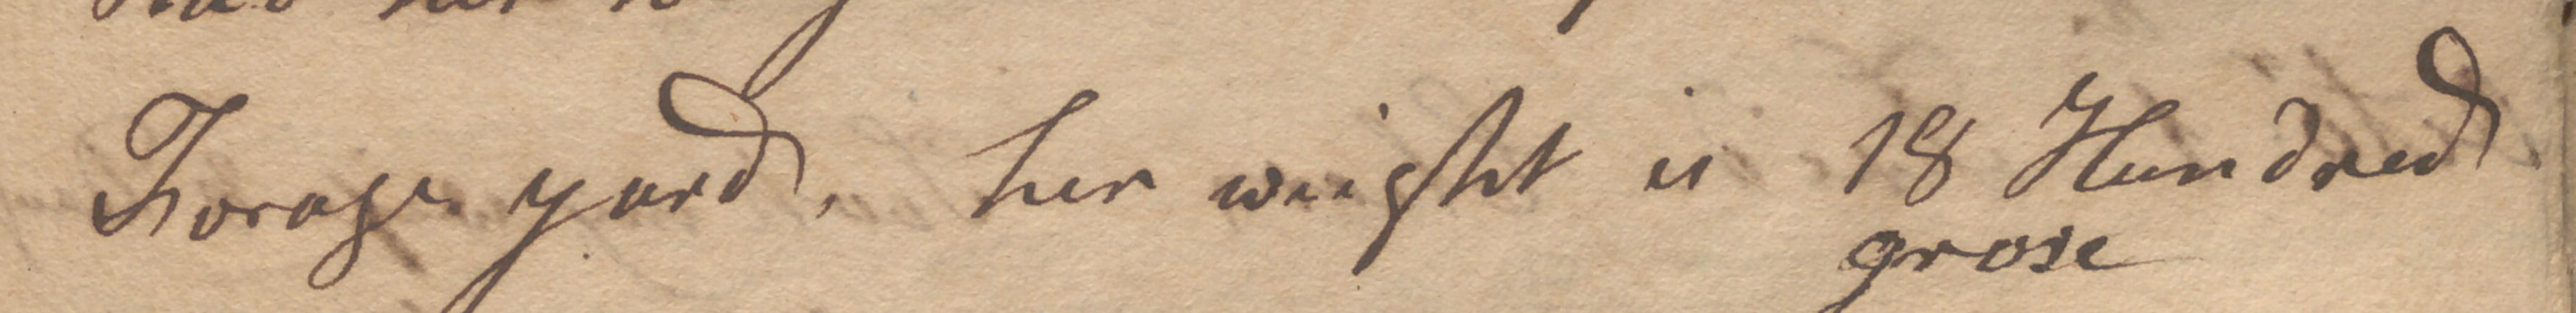Forage yard. her weight is 18 Hundred
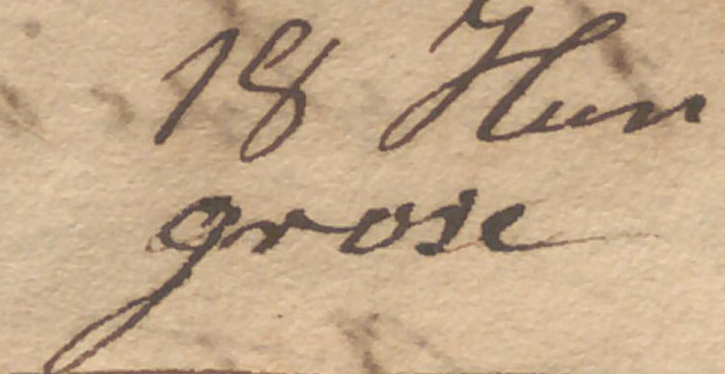grose
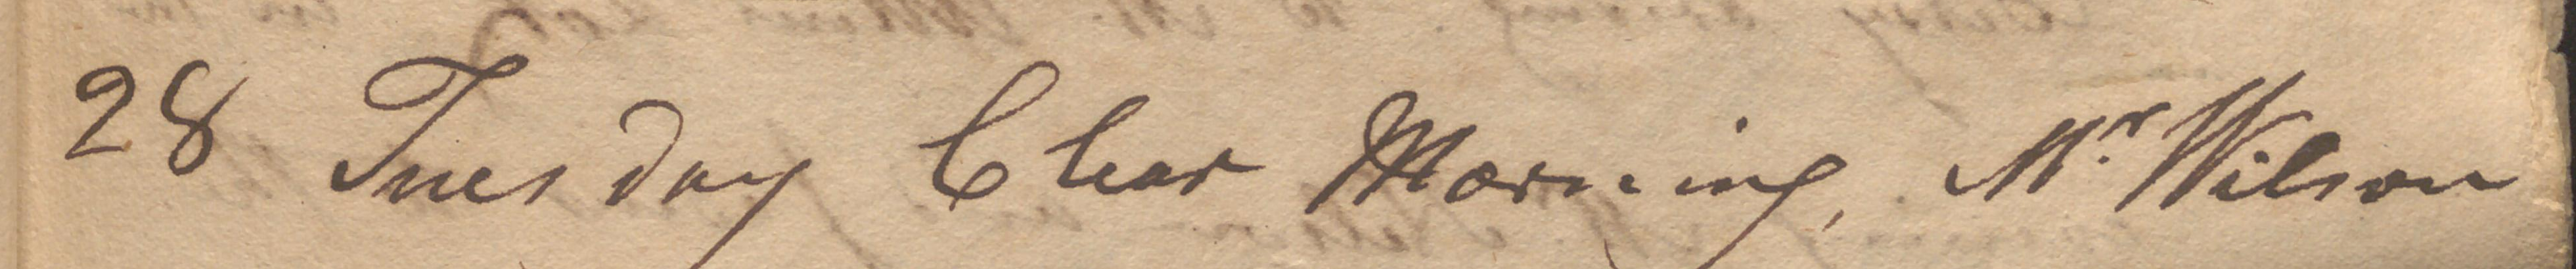28 Tuesday Clear Morning M^r. Wilson
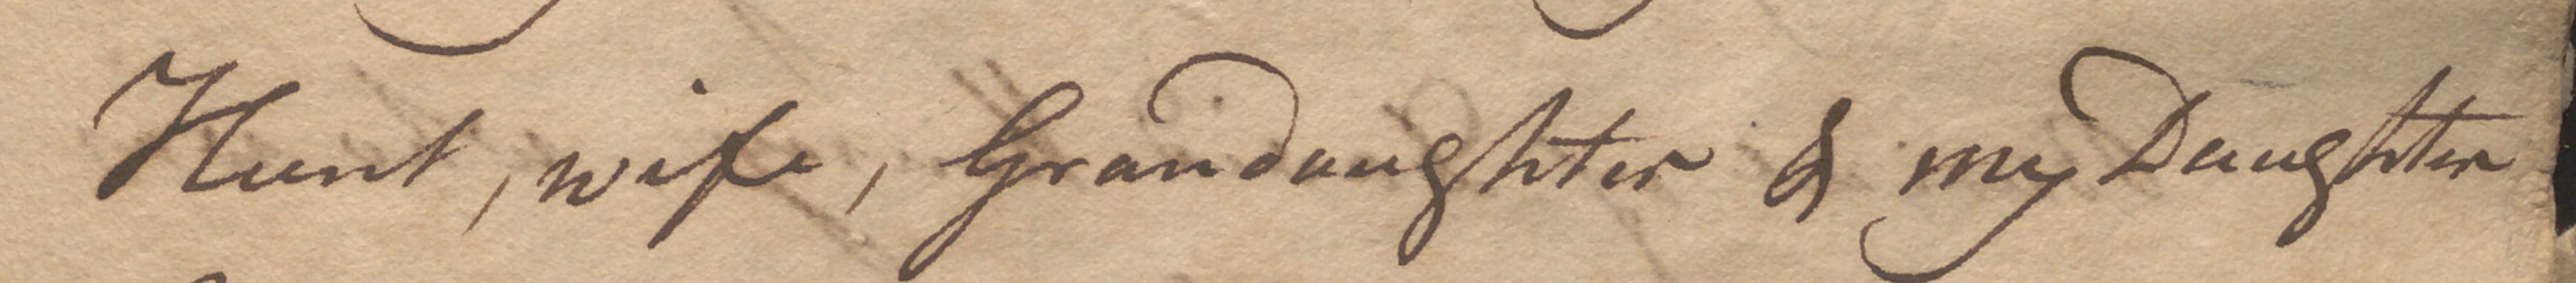Hunt, wife, Grandaughter & my Daughter
